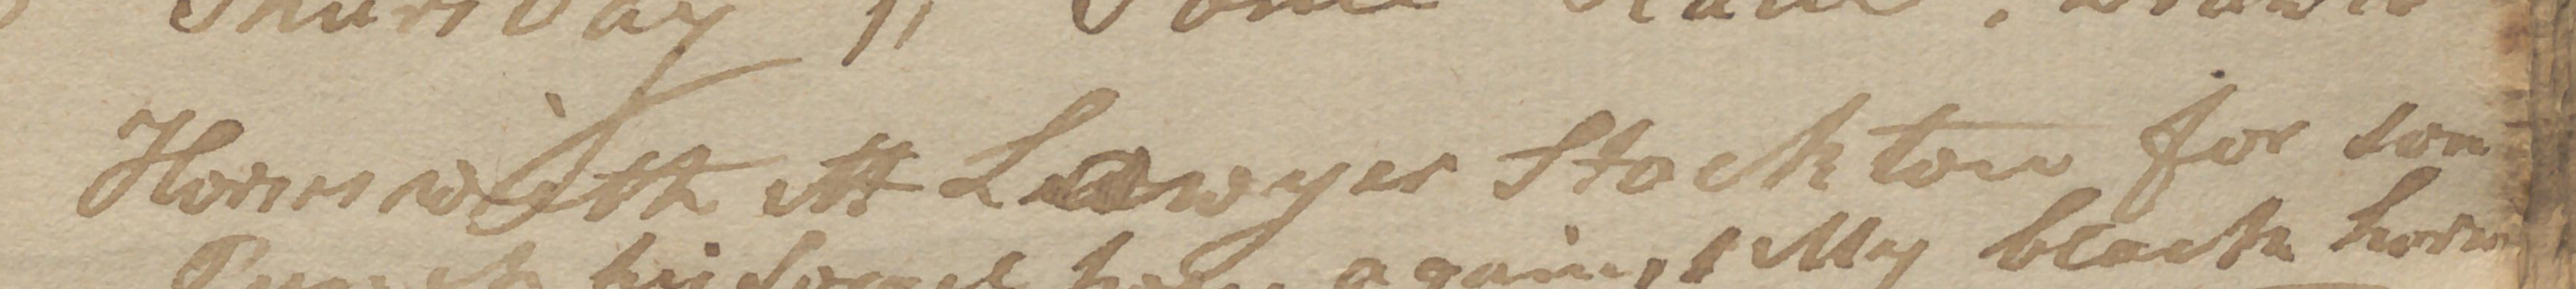Horses with M Lawyer Stockton for son
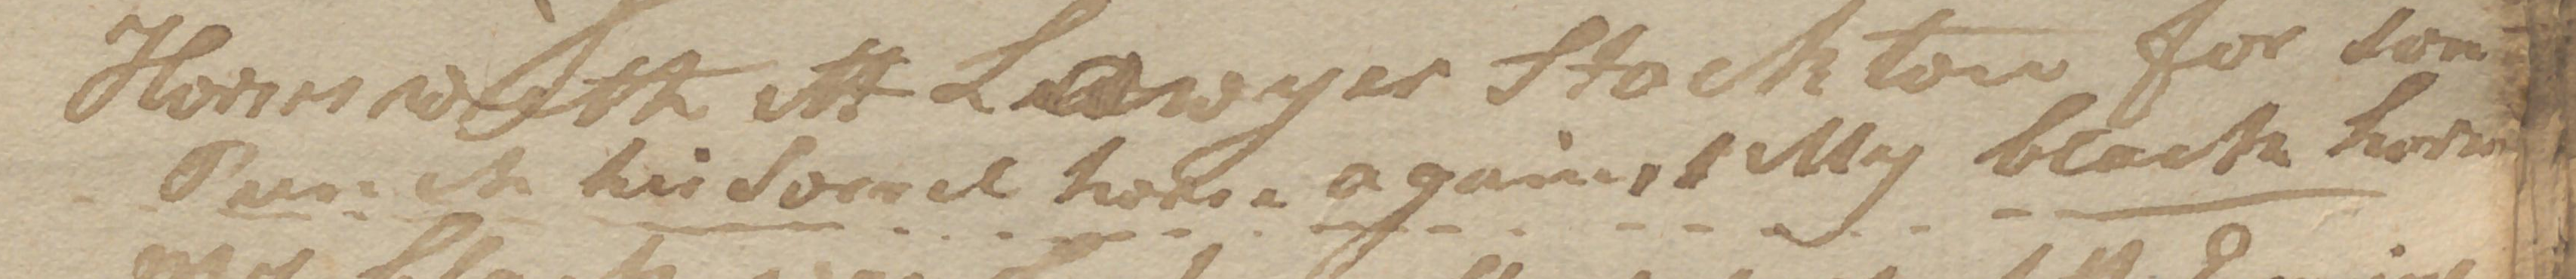Punch his sorrel horse against My black horse
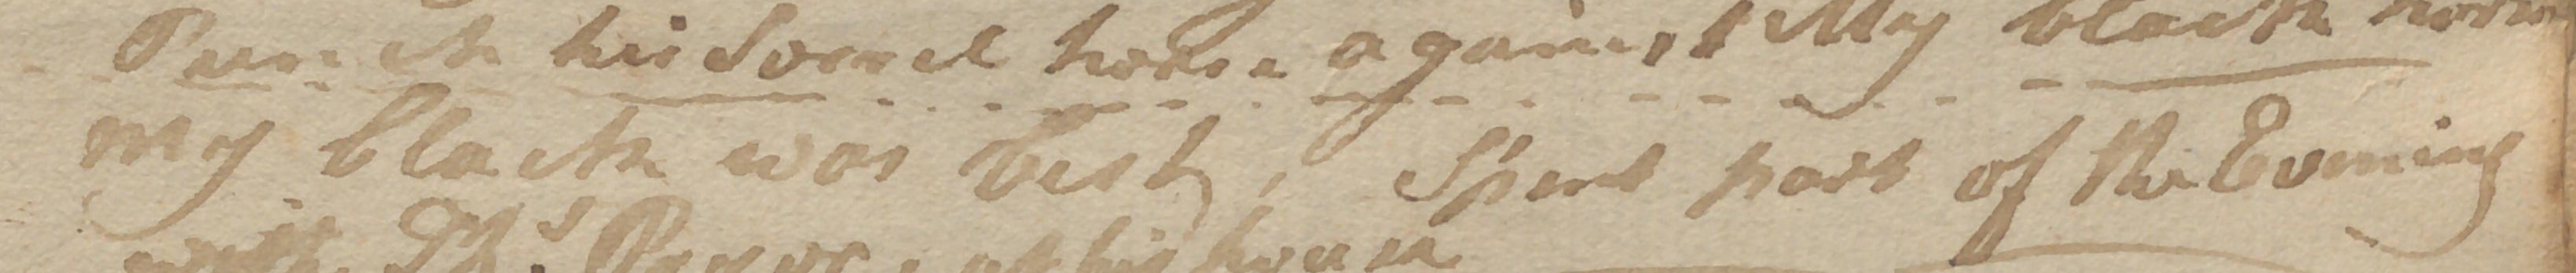my black was best, Spent part of the Evening
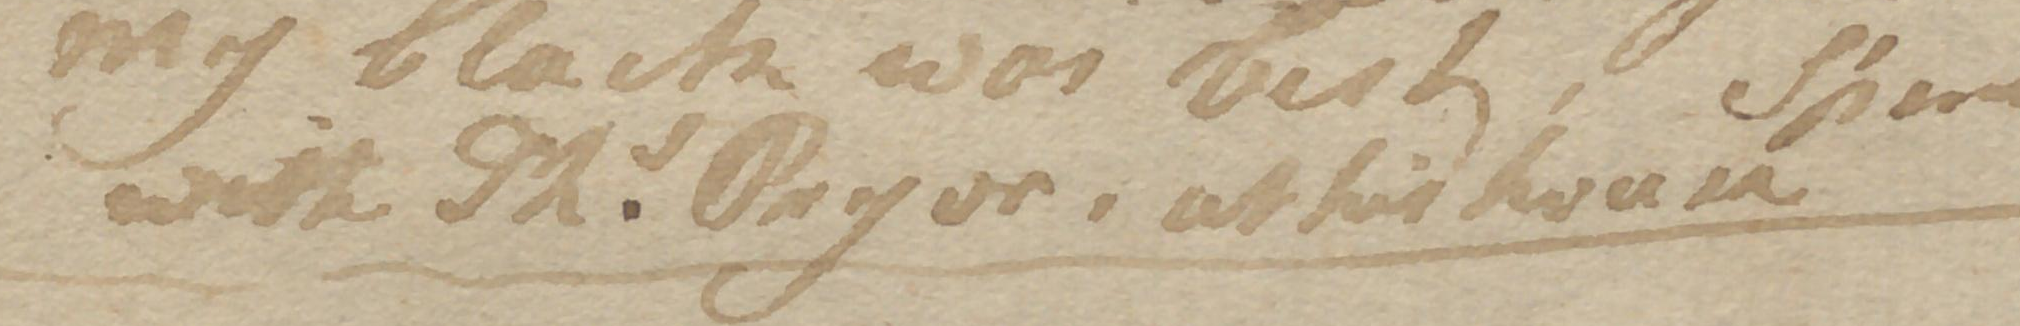with Th^s. Pryor at his house
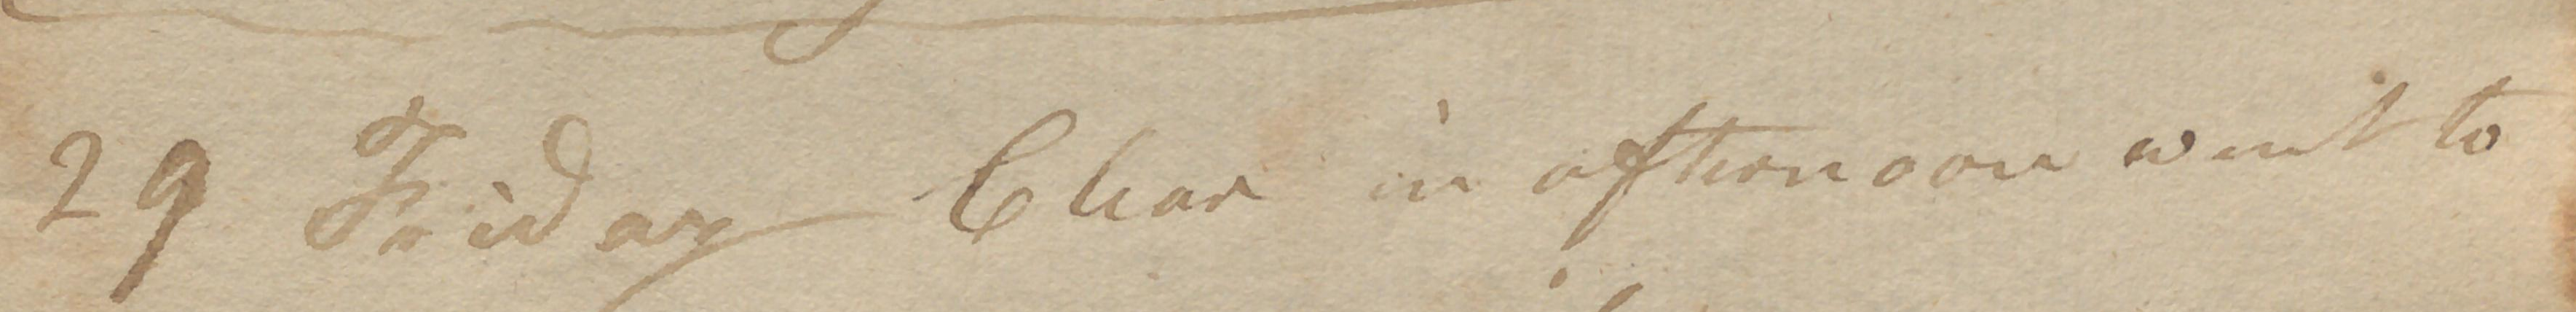29 Friday Clear n afternoon went to
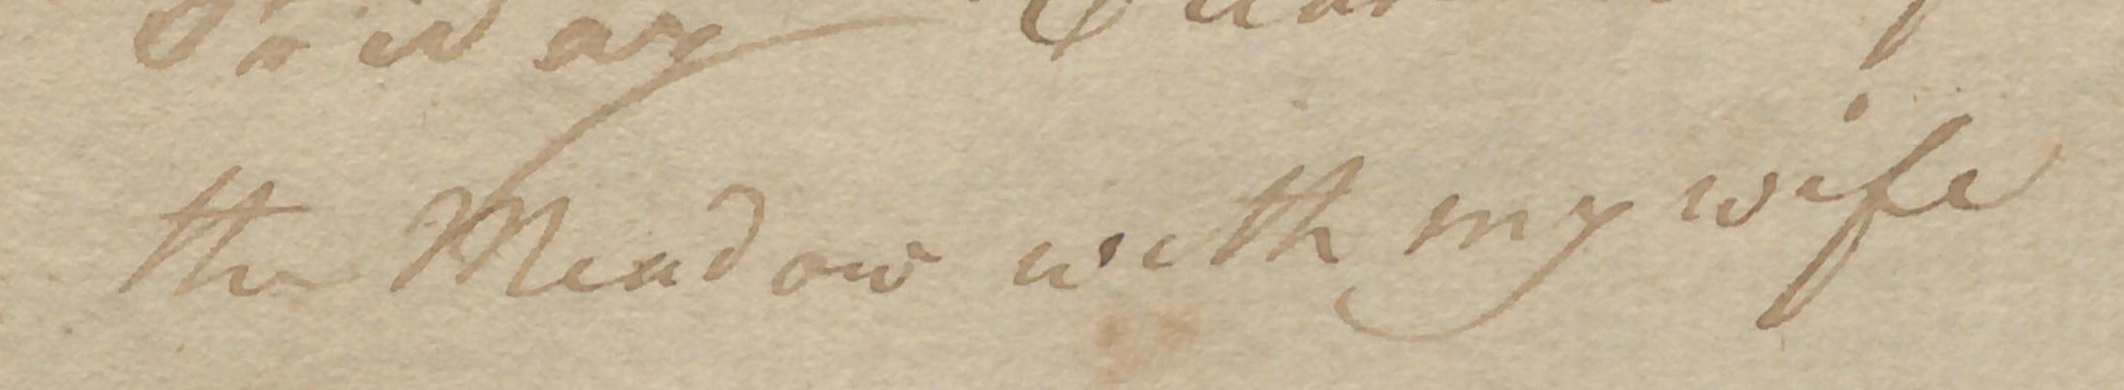th Meadow with my wife
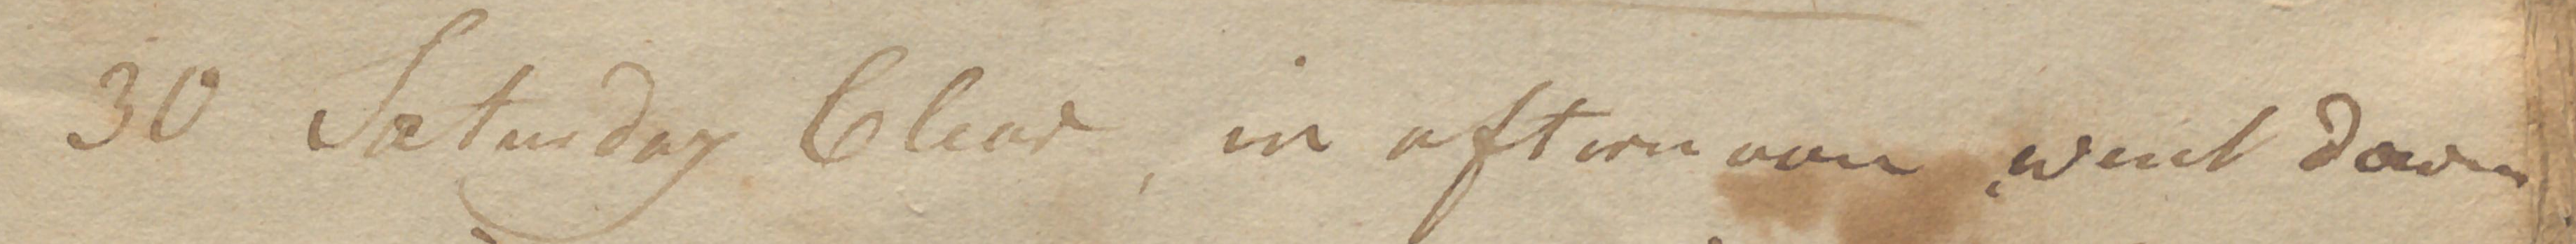30 Saturday Clear in afternoon went down
